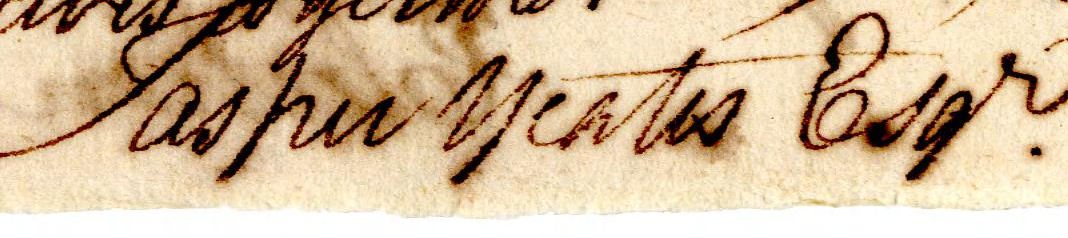Jasper Yeates Esq^r
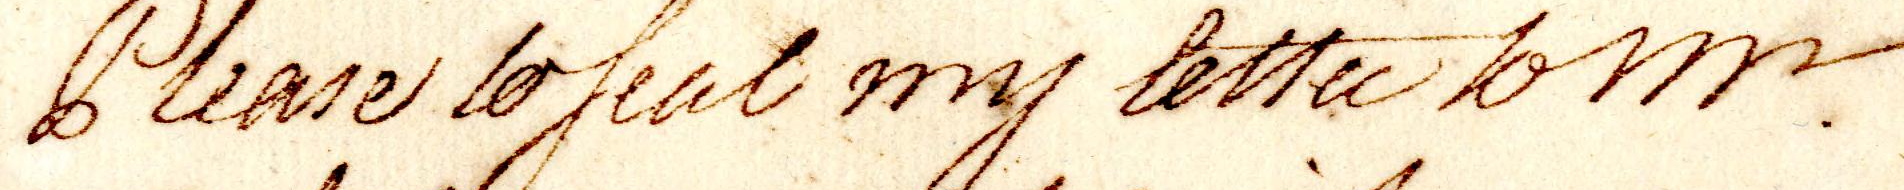Please to seal my letter M^r
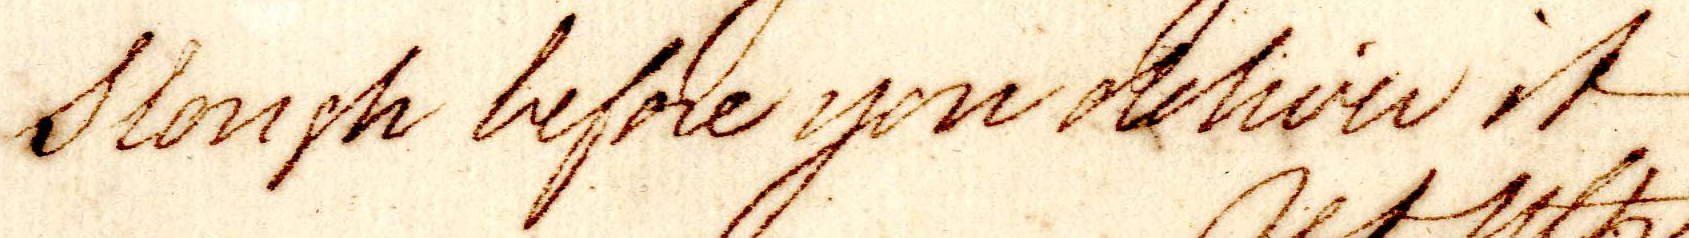Slough before yon deliver it
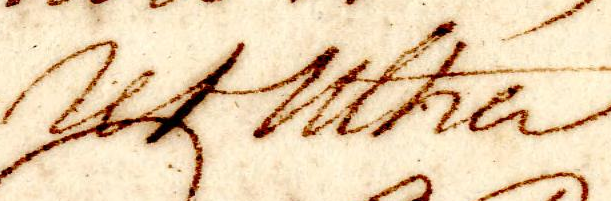Ut ultra
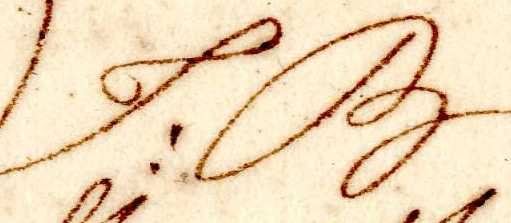J. B
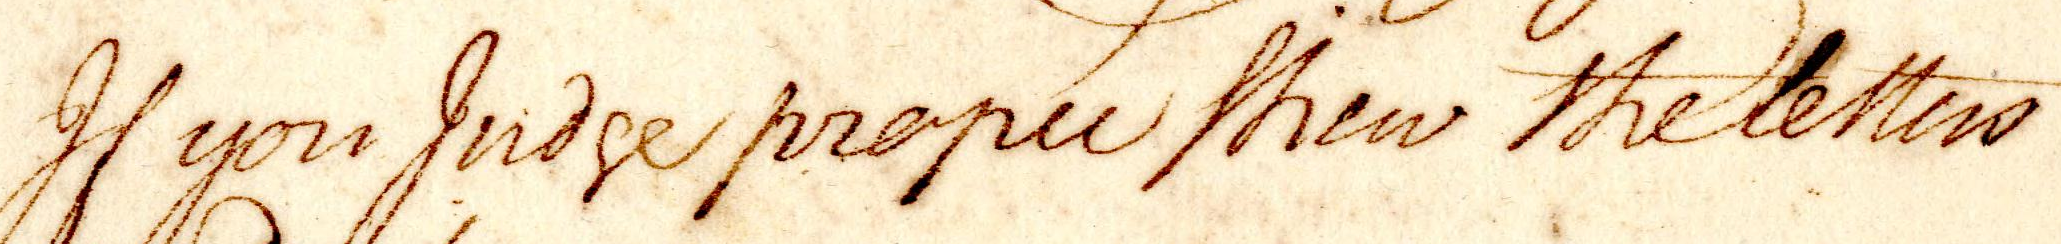If you Judge proper shew the letters
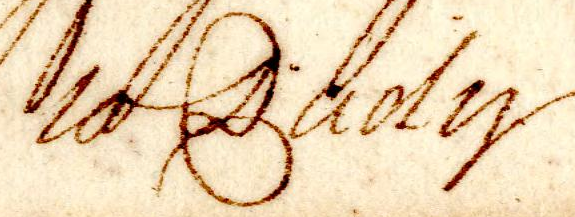to Dady
